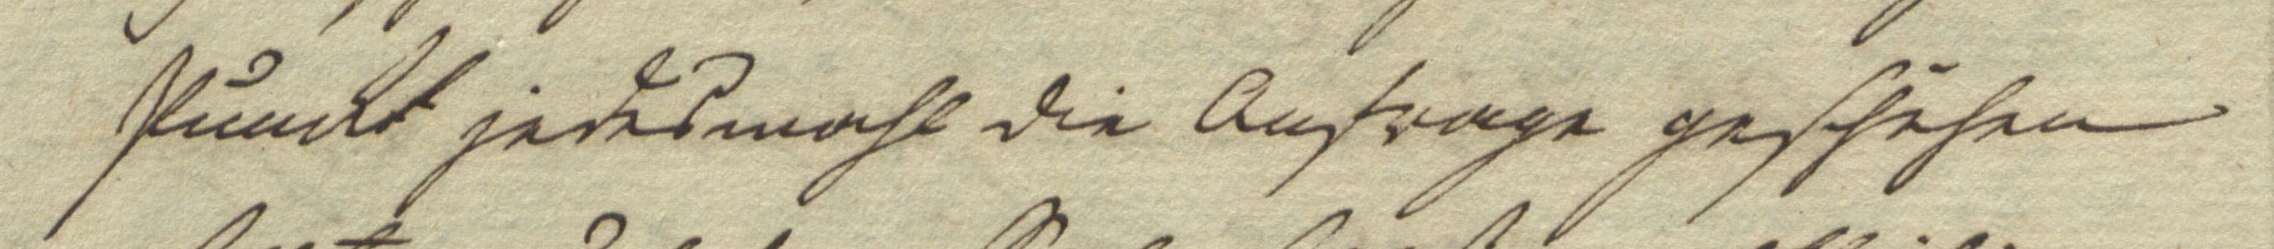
Punkt jedesmahl die Anfrage geschehen
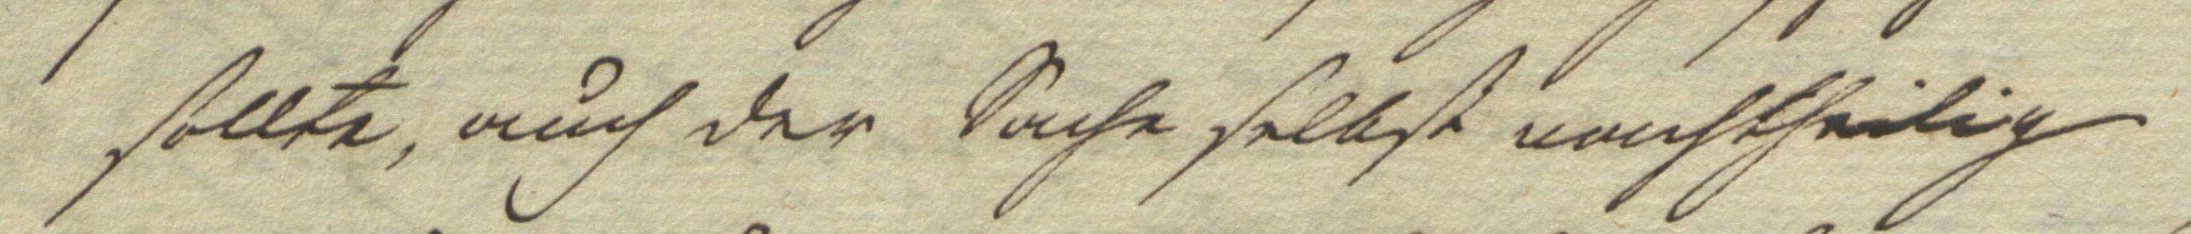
sollte, auch der Sache selbst nachtheilig
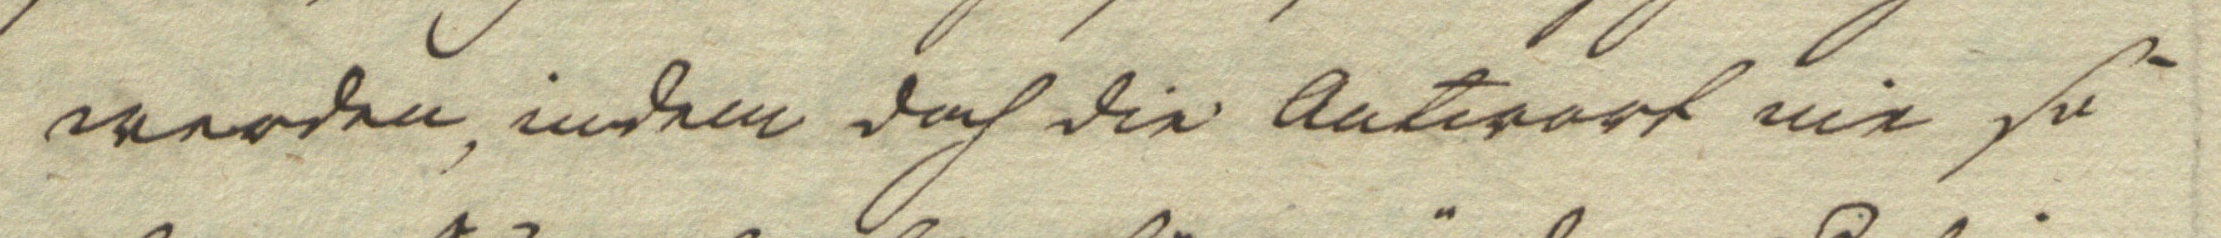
werden, indem doch die Antwort nie so
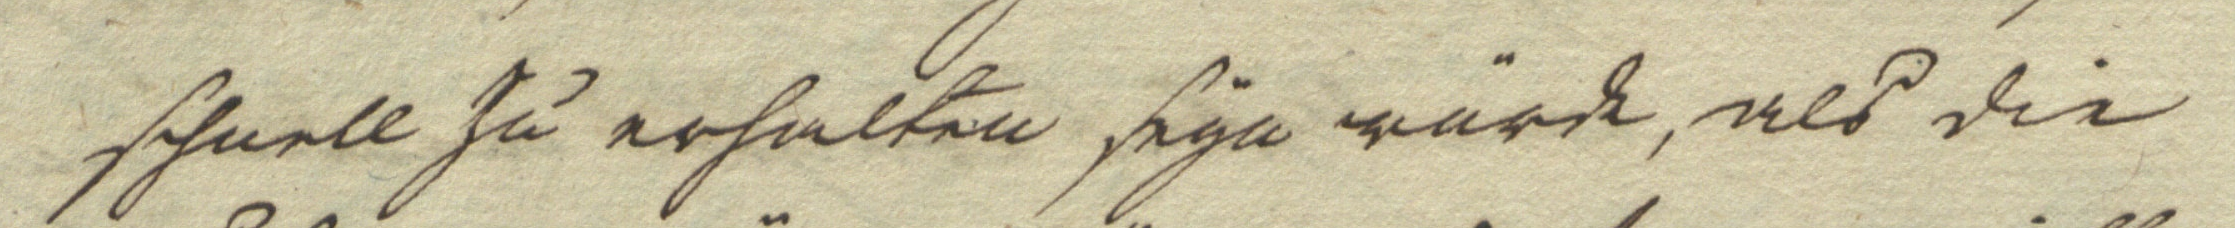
schnell zu erhalten seyn würde, als die
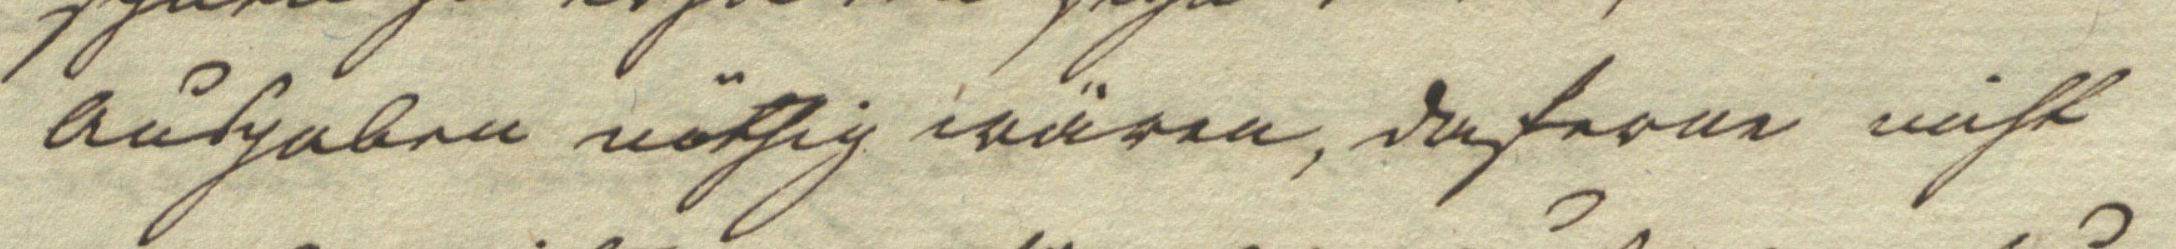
Ausgaben nöthig wären, daferne nicht
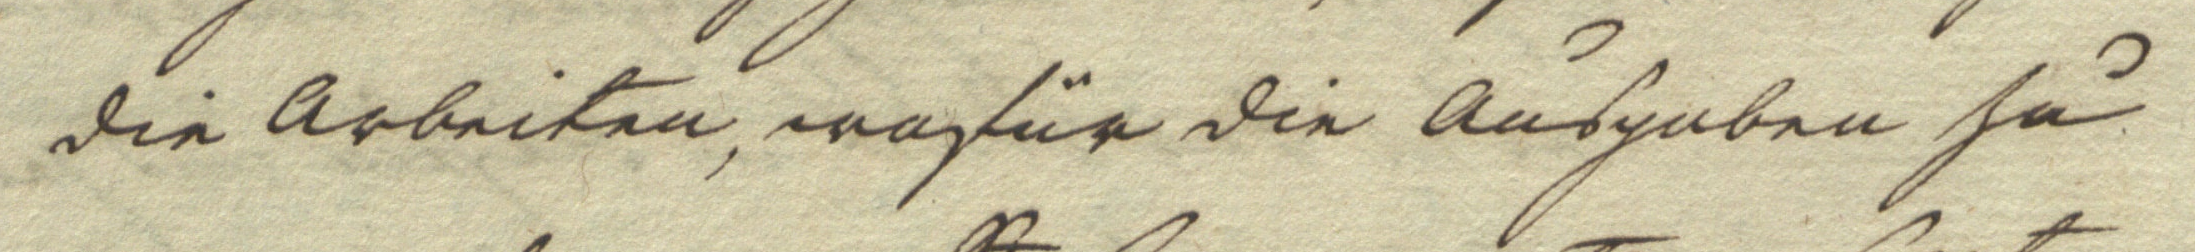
die Arbeiten, wofür die Ausgaben zu
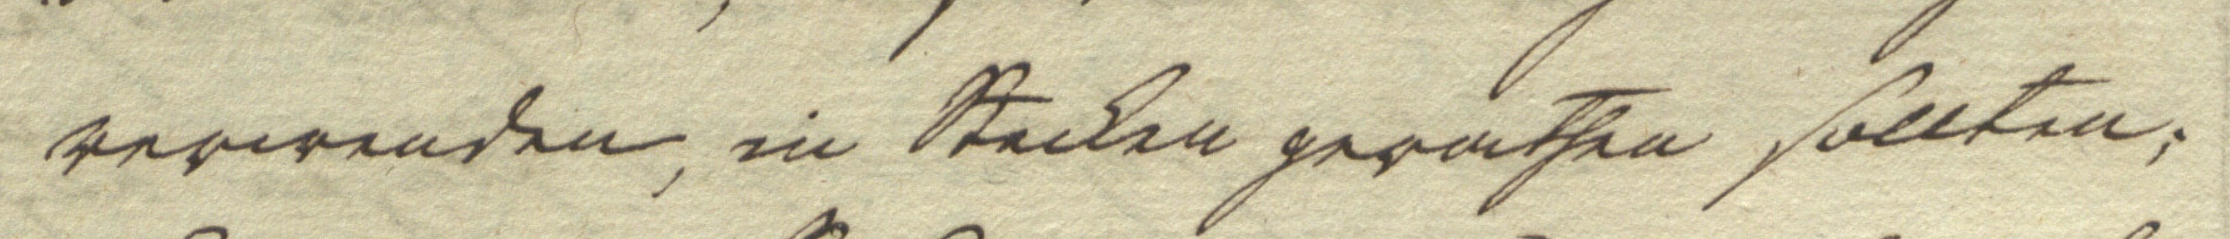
verwenden, in Stecken gerathen sollten,
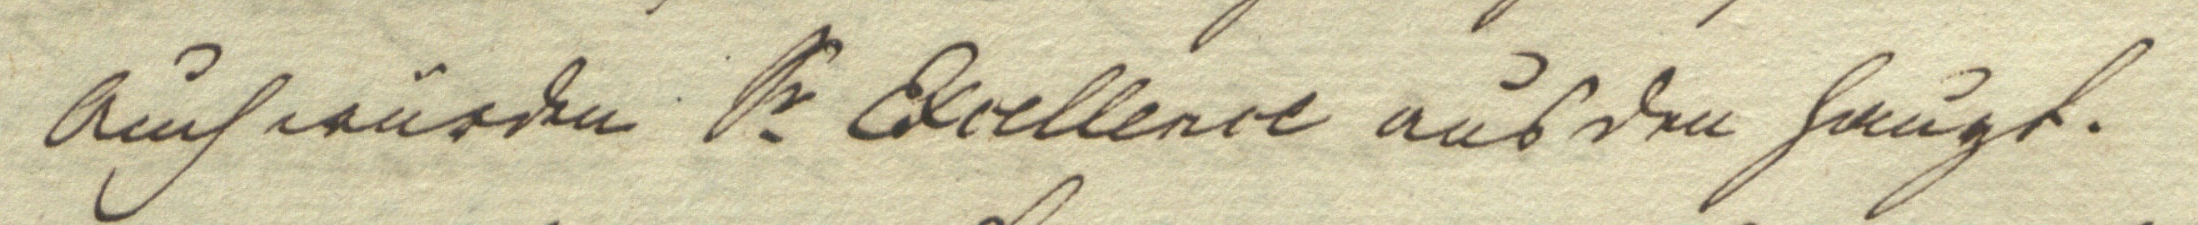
Auch würden Sr. Excellence aus den Haupt¬
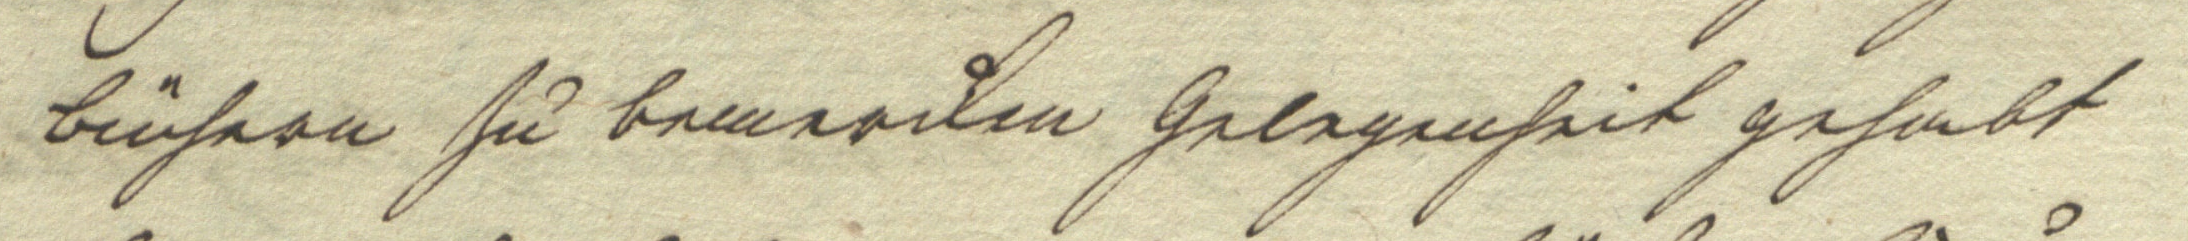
büchern zu bemerken Gelegenheit gehabt
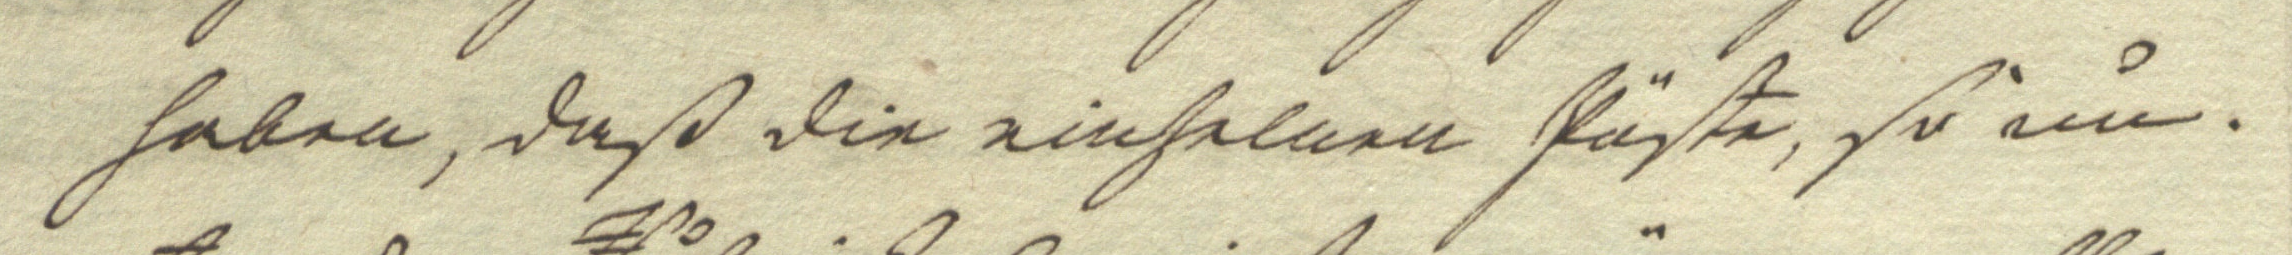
haben, daß die einzelnen Pöste, so un¬
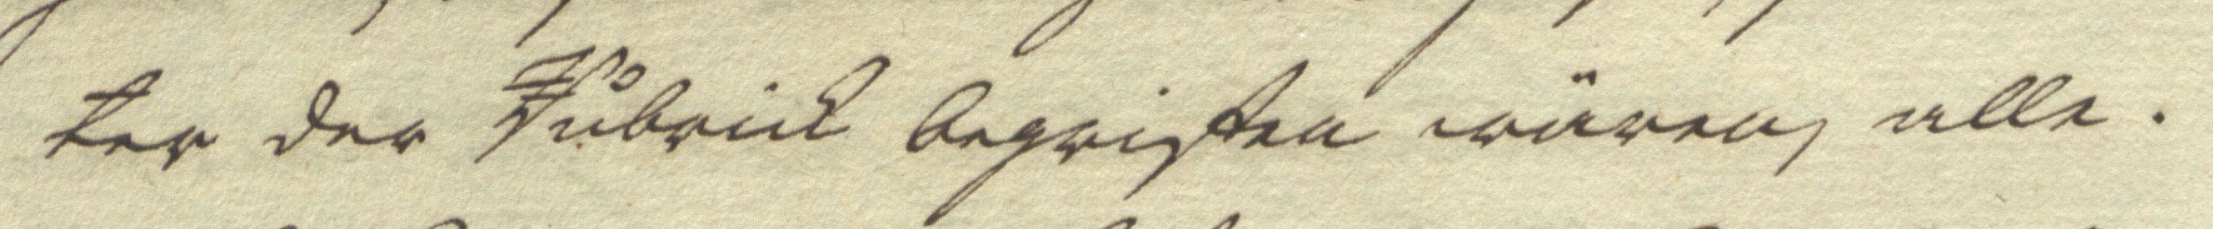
ter der Rubrik begrifen wären, alle¬
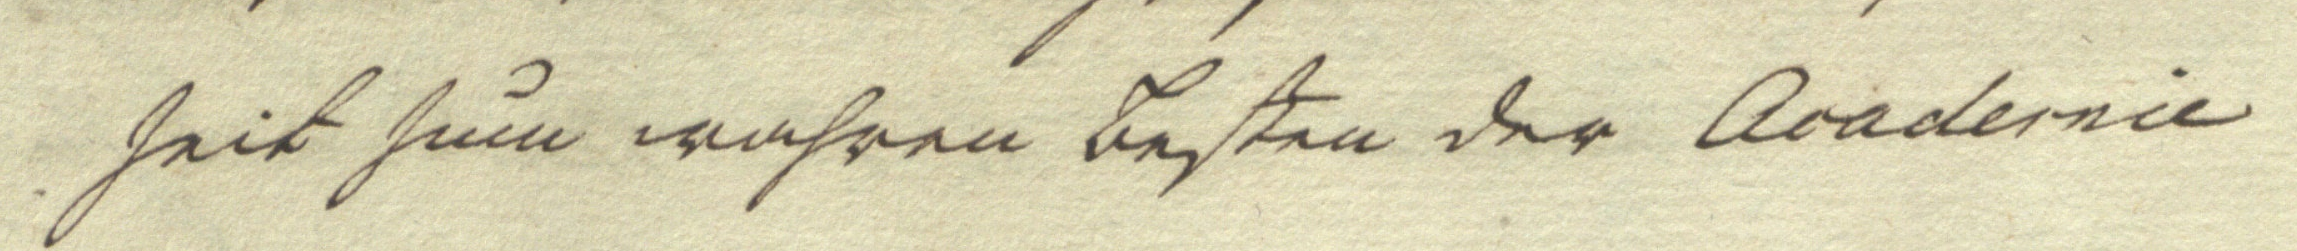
zeit zum wahren Besten der Academie
